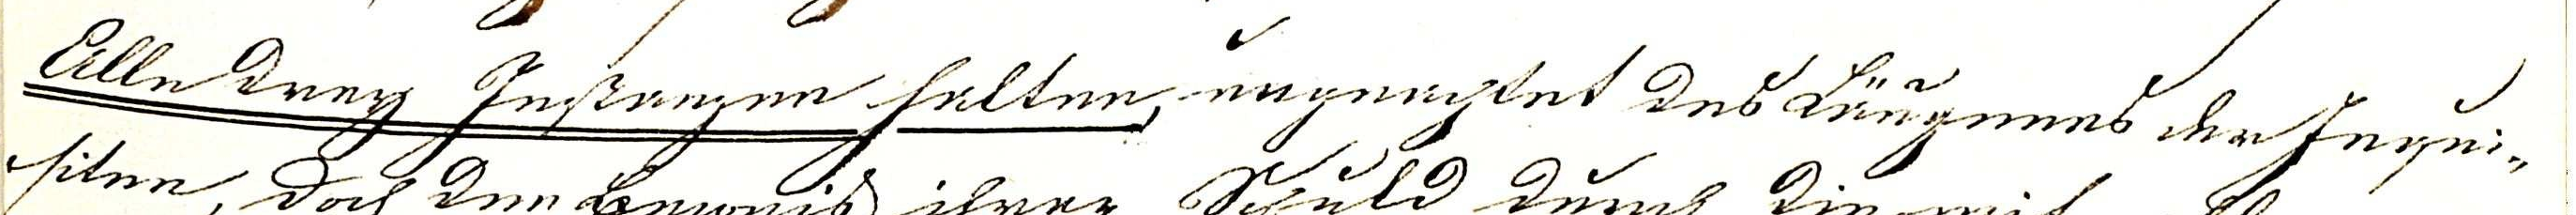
Alle Krey Inßengen halten, ungnagte des Läugnes der Inqui¬
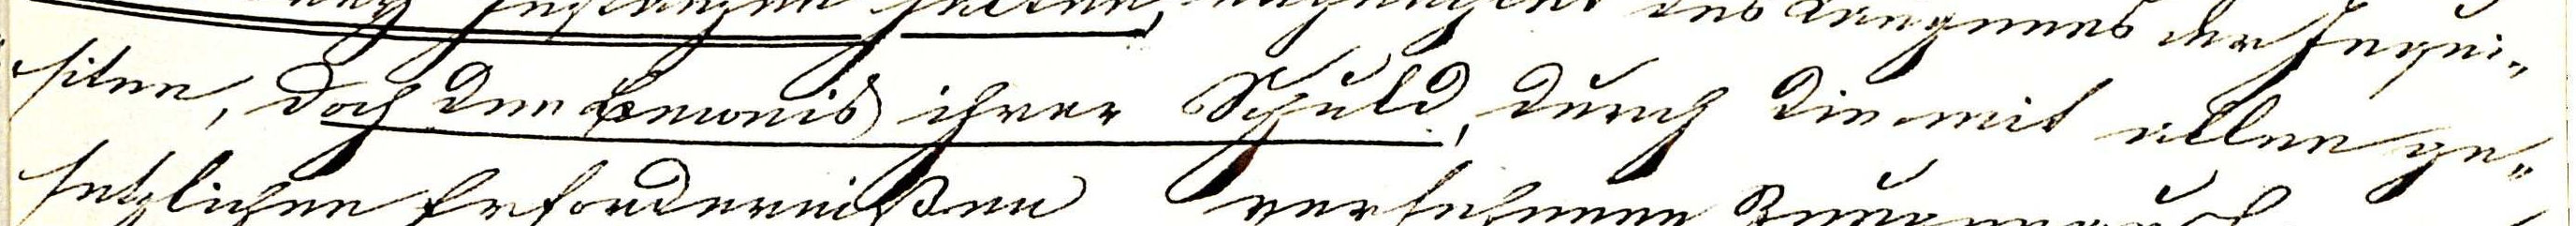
siten, doch den Beweis ihrer Schuld, durch die mit allen ge¬
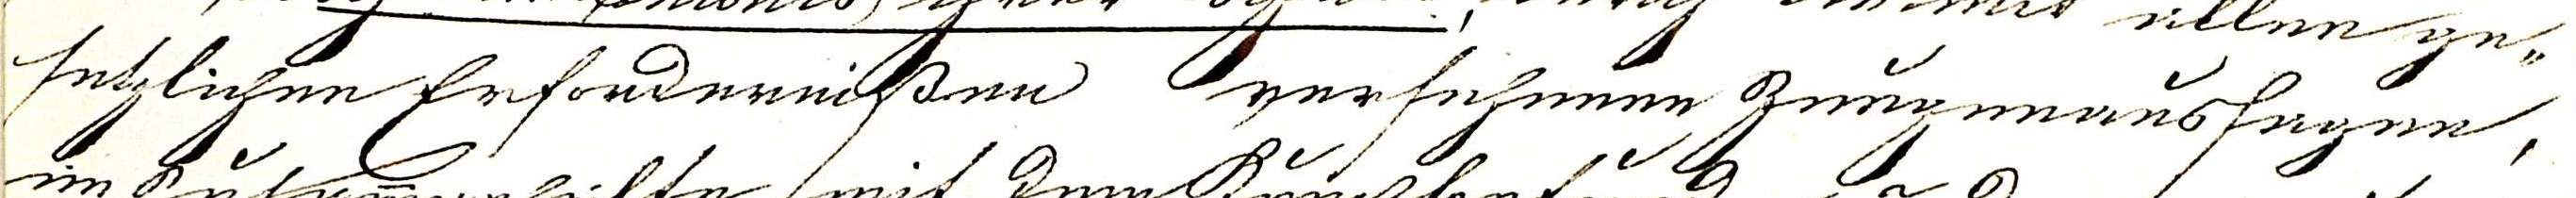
setzlichen Erfordernißen versehenen Zeugenaussagen,
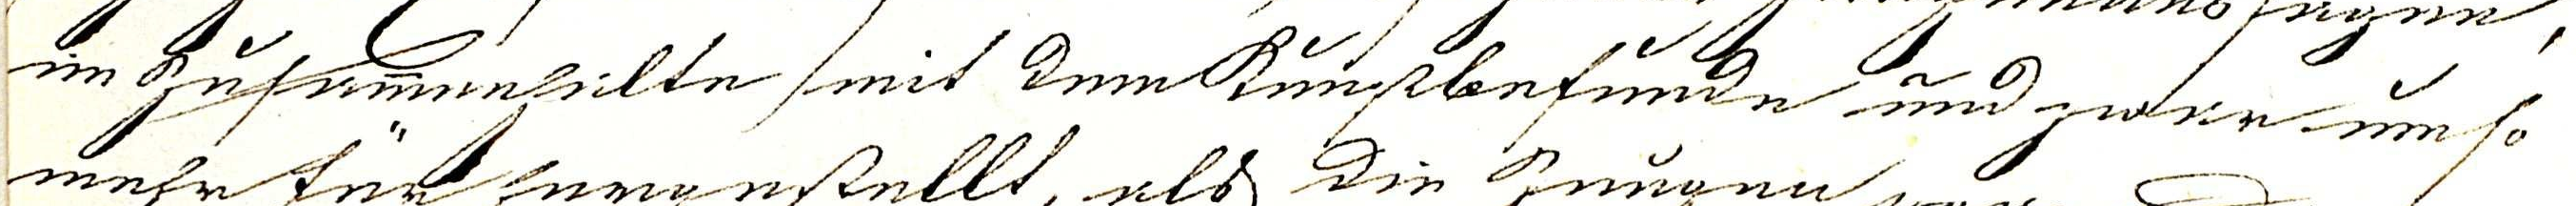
im zusammenhalte mit dem Kunstbefunde und zwar um so
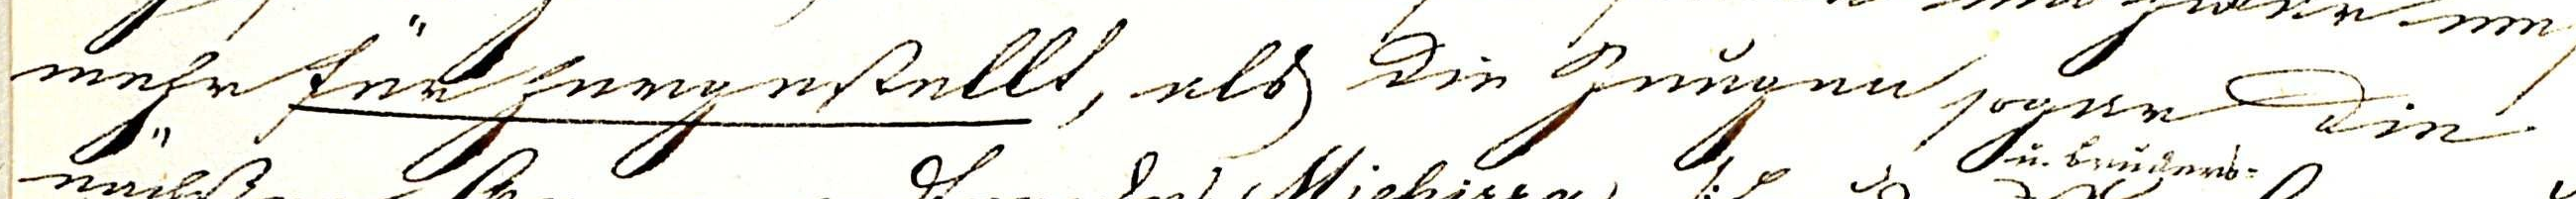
mehr für zugestellt, als die Zeugen sogar die
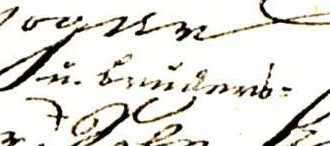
u. bruders
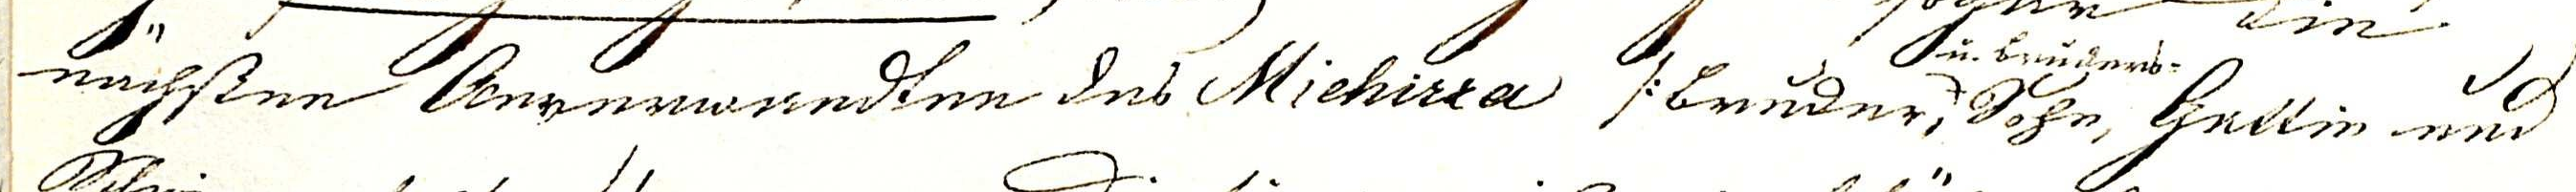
nächßen Anverwandten das Michirra /:Bruder, Sohn, Gattein und
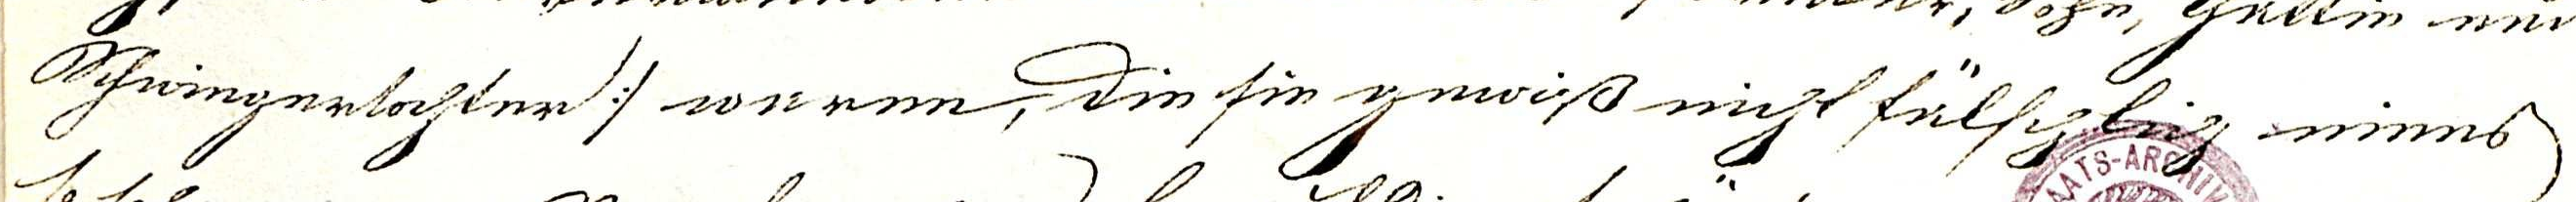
Schwiegertochter:/ waren, die sie gewiß nicht fälschlich eines
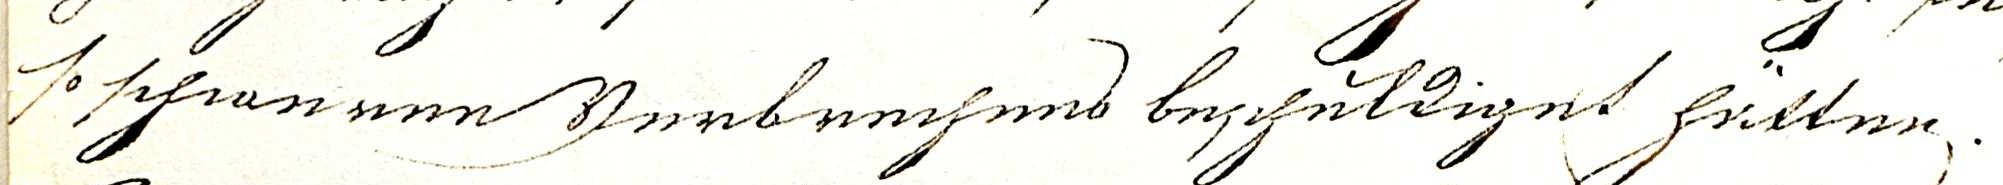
so schweren Verbrechens beschuldiget hätter.
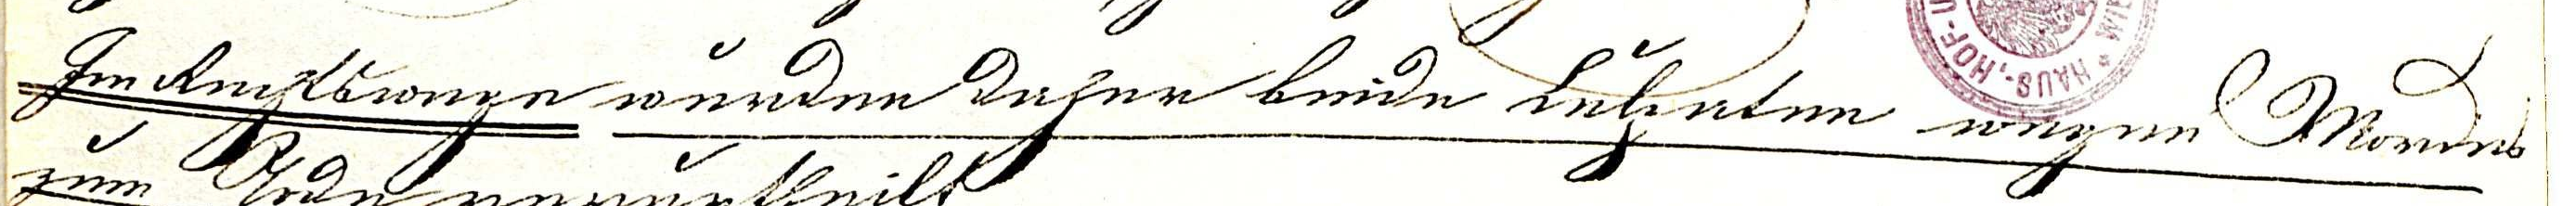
Im Anchtswege wurden daher beide Lelzaten wegen Mondes
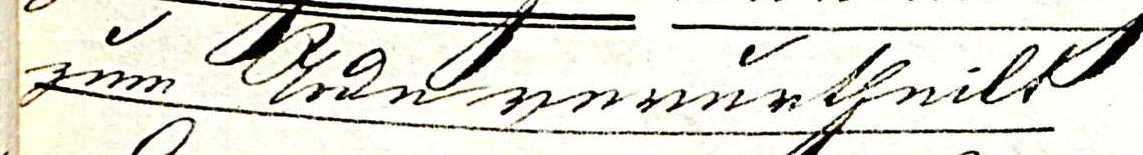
zum Andewerurtheilt
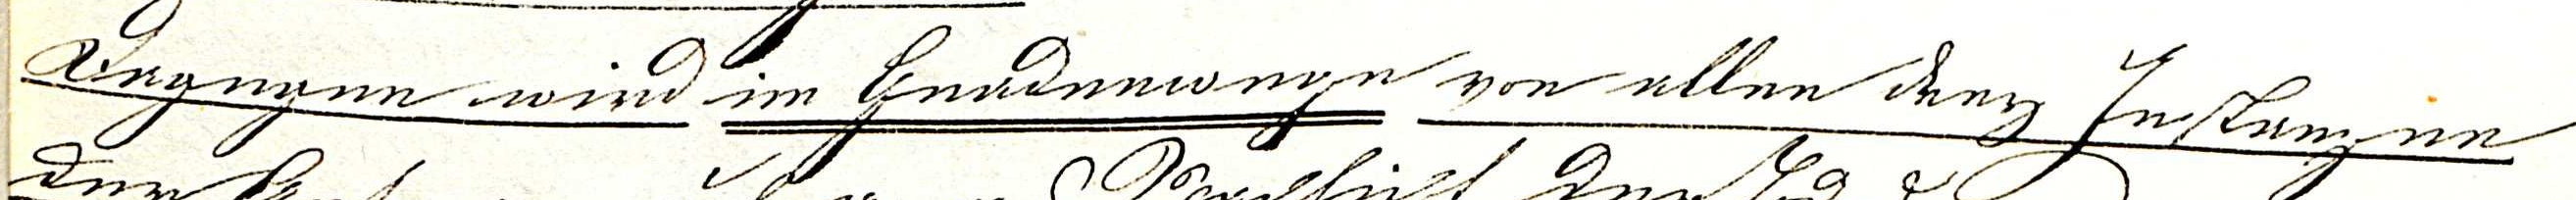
Dagegen wird im Gnadenwege von allen dez Instanzen
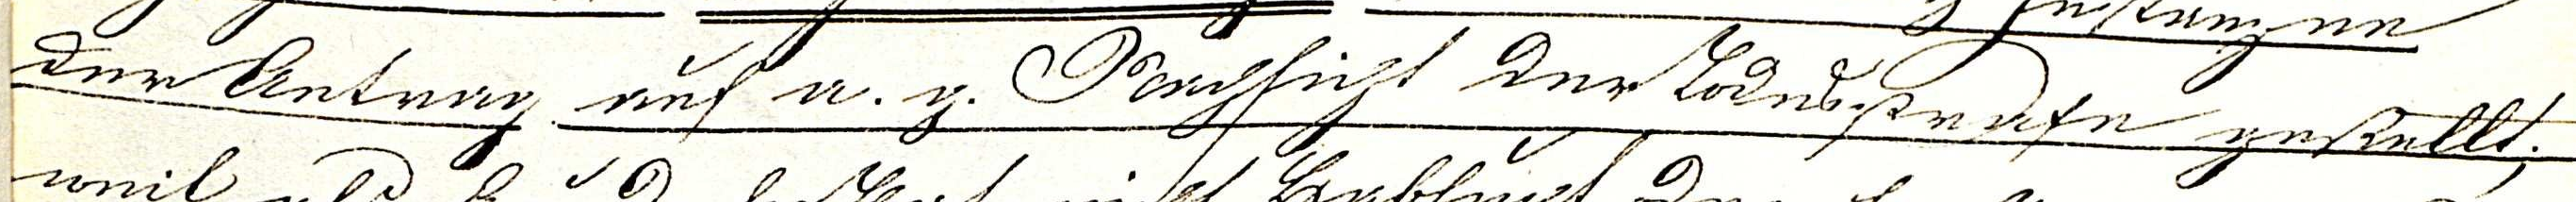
der Antrag auf a. g. Nachsicht der Todesstrafe geßellt;
